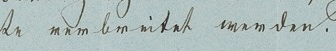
te verbreitet werden.
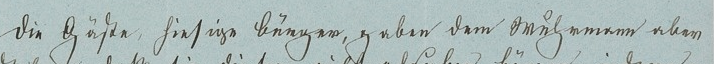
Die Gäste, hiesige Bürger, gaben dem Wuhrmann aber
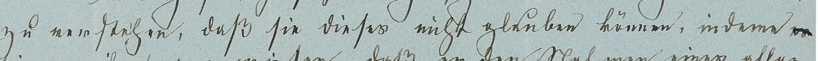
zu verstehen, daß sie dieses nicht glauben können, indeme
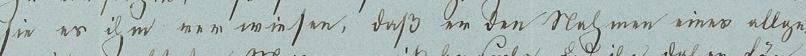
sie es ihm verwiesen, daß er den Nahmen eines allge-
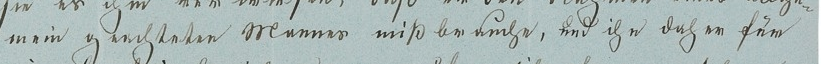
mein geachteten Mannes missbrauche, und ihn daher für
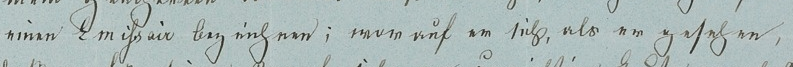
einen Emissair bezeichnen; worauf er sich, als er gesehen,
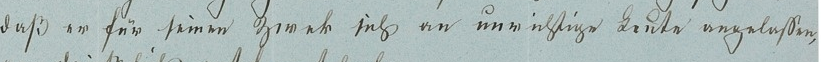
daß er für seinen Zwek sich an unrichtige Leute angelassen,
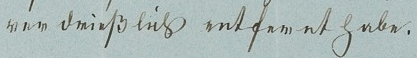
verdrießlich entfernt habe.
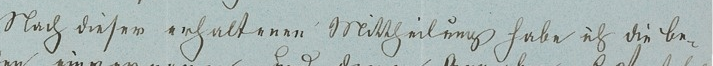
Nach dieser erhaltenen Mittheilung habe ich die Be-
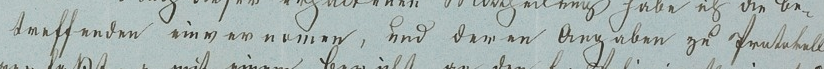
treffenden einvernommen, und deren Angaben zu Protokoll
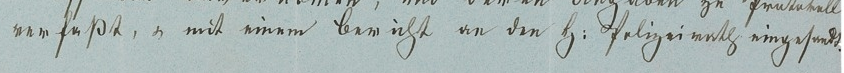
verfasst, & mit einem Bericht an den H: Polizeirath eingesandt.
